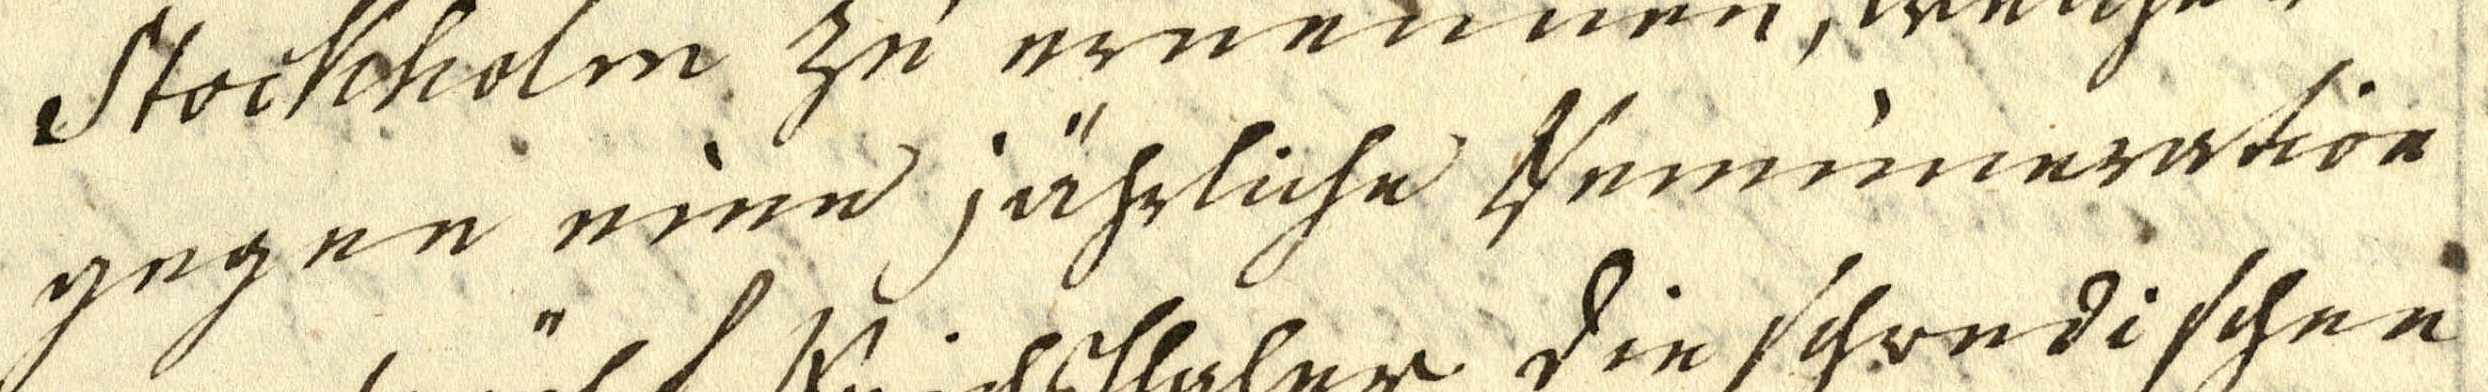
gegen eine jährliche Remuneration
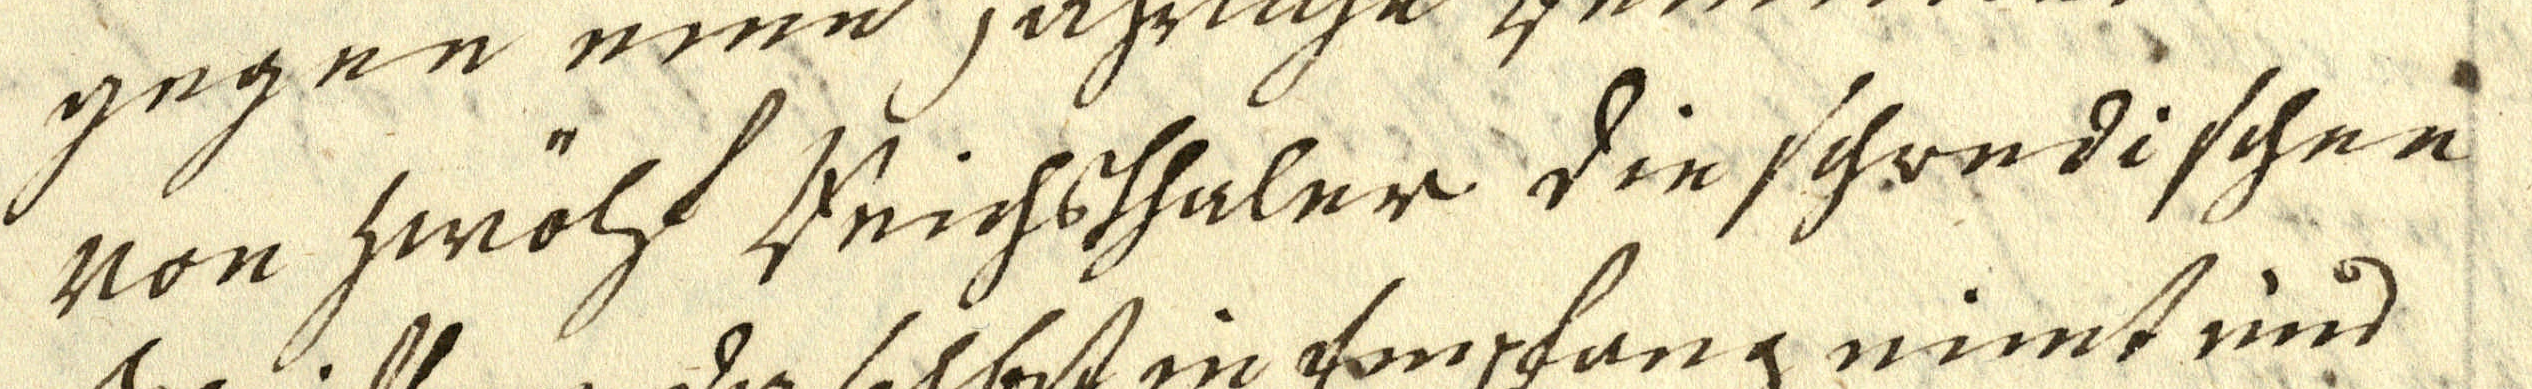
von zwölf Reichsthaler die schwedischen
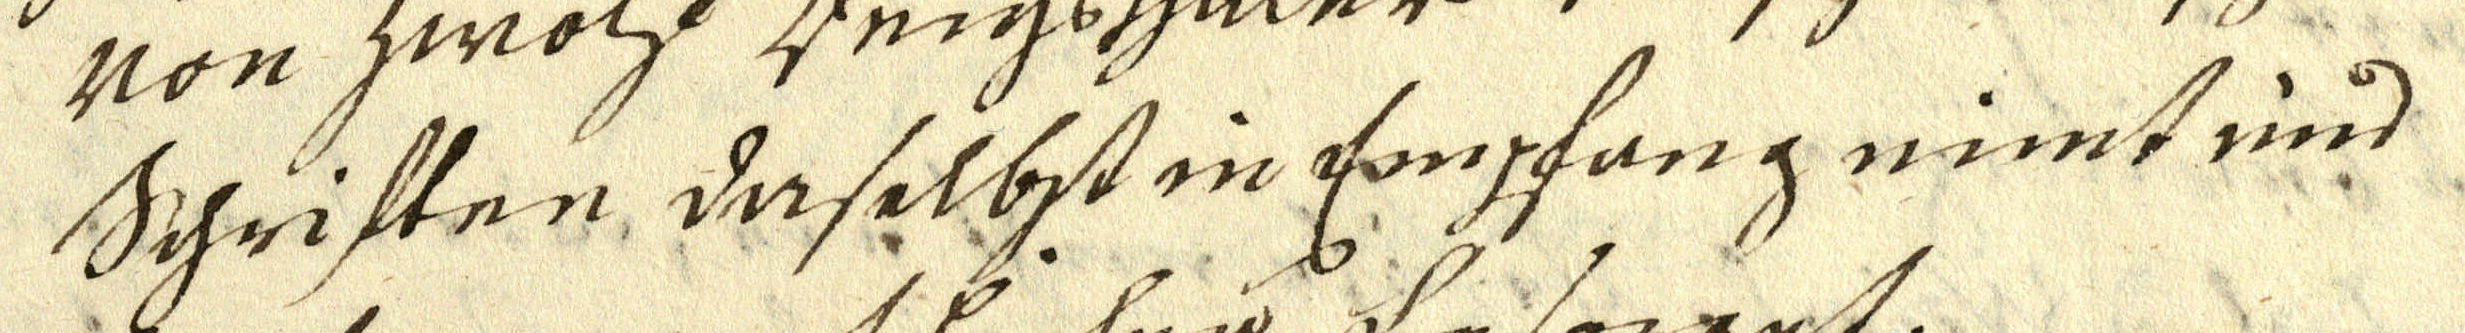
Schriften daselbst in Empfang nimt und
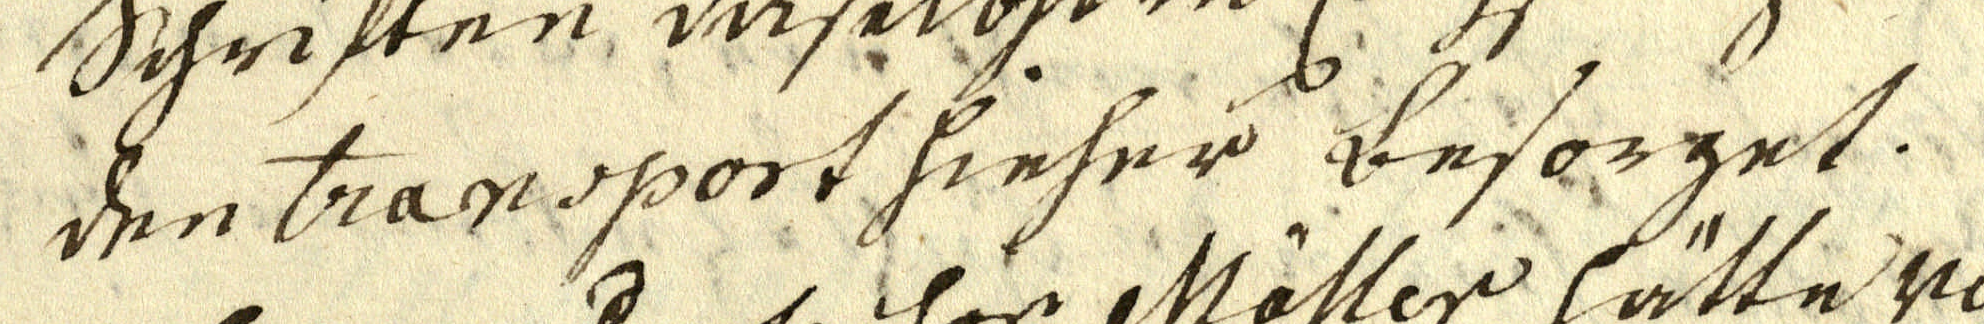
den Transport hieher besorget.
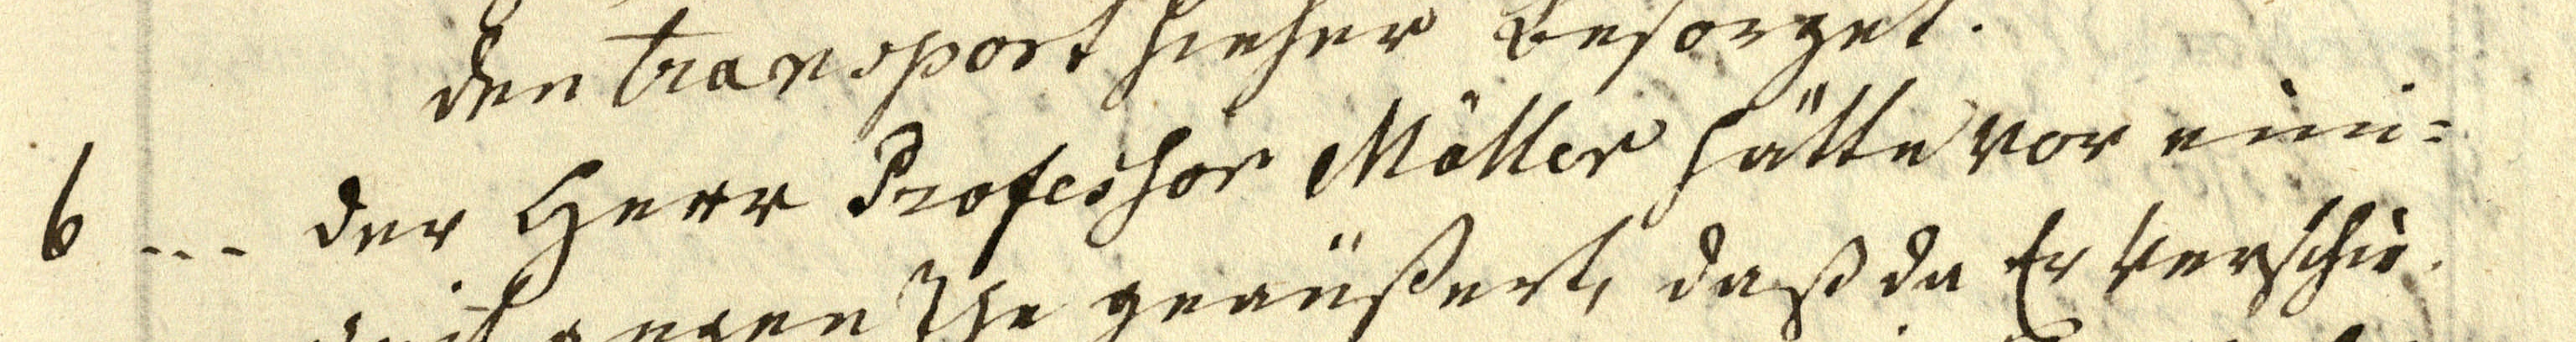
6. der Herr Professor Möller hätte vor eini¬
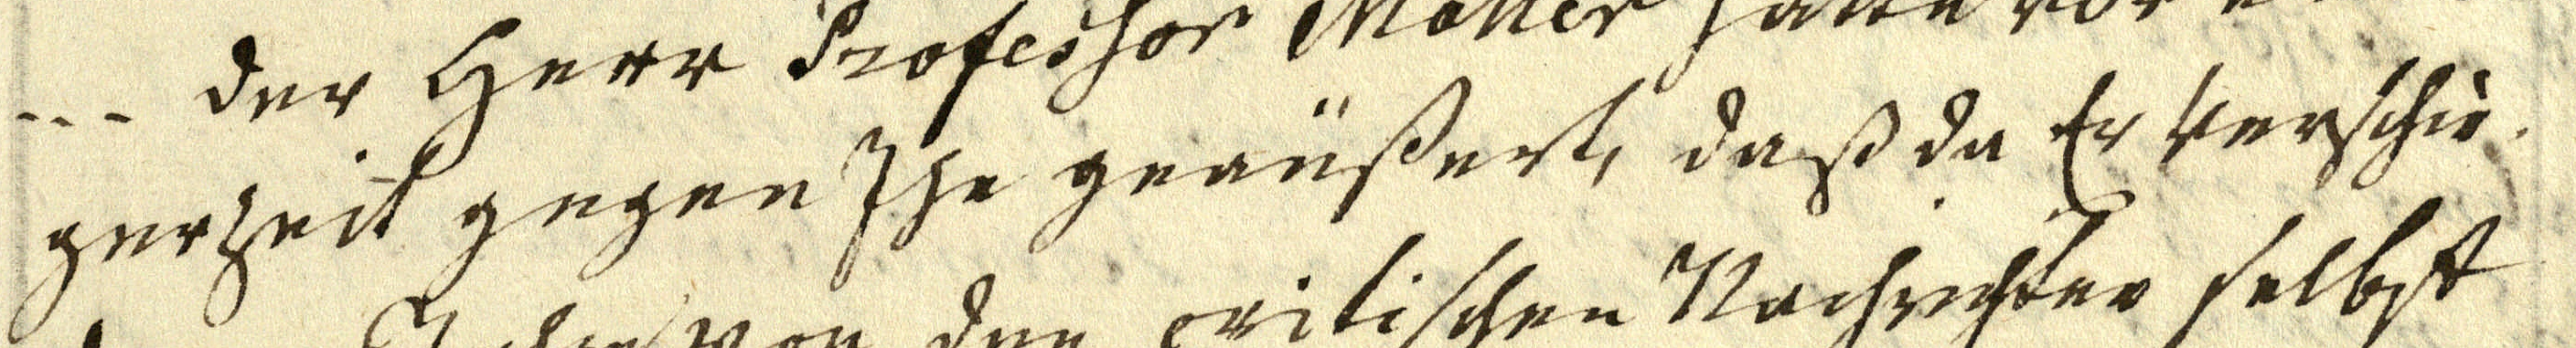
ger Zeit gegen Ihn geäußert, daß da Er verschie¬
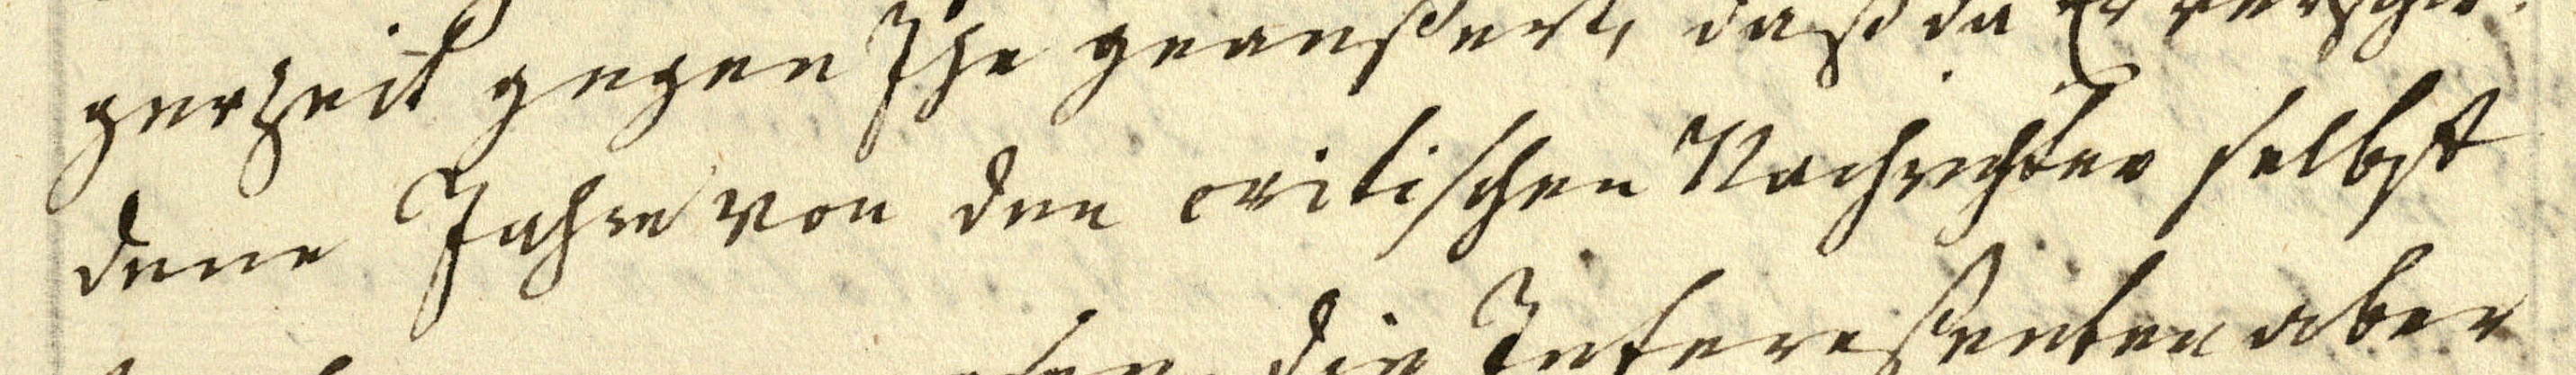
dene Jahre von den critischen Nachrichten selbst
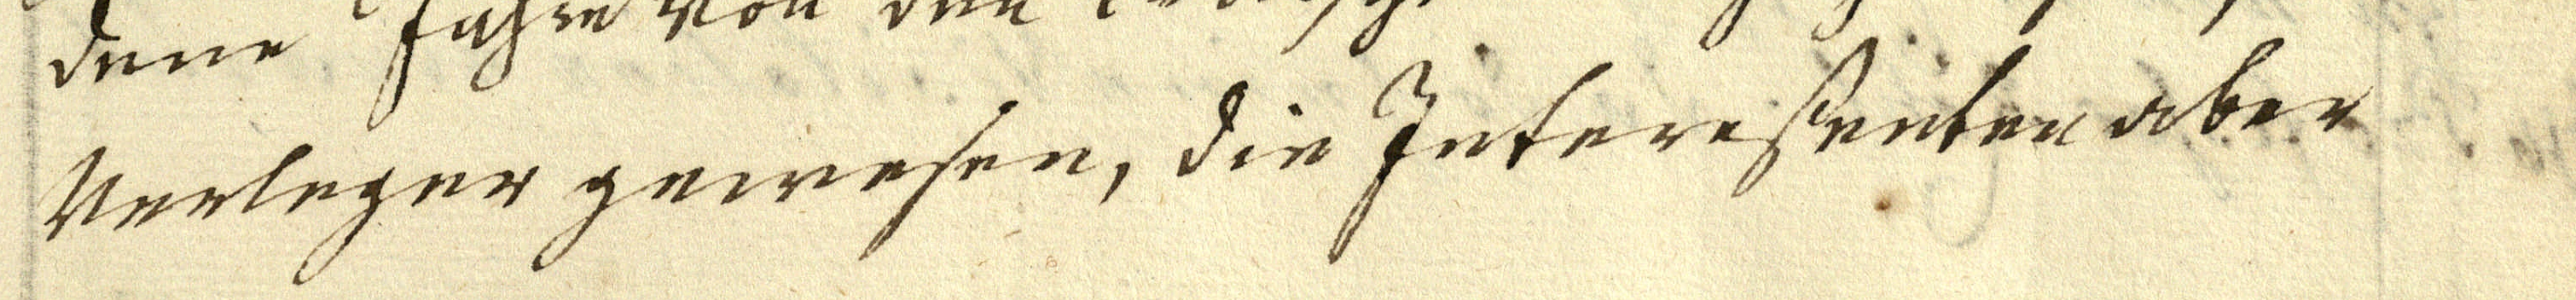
Verleger gewesen, die Intereßenten aber
